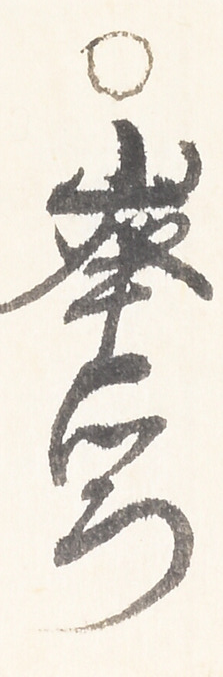〇弥右衛門
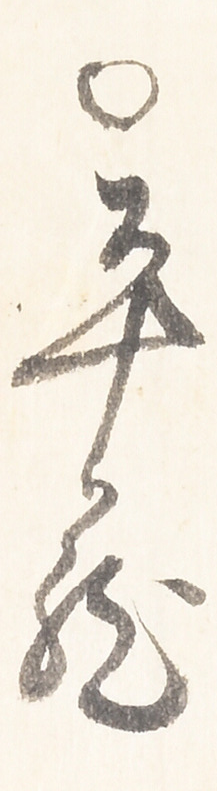〇平蔵
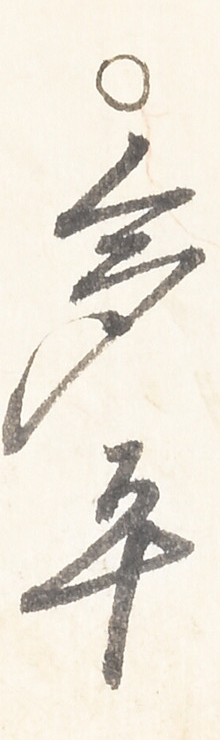〇多平
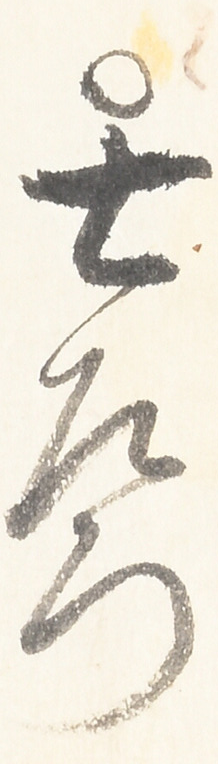〇七左衛門

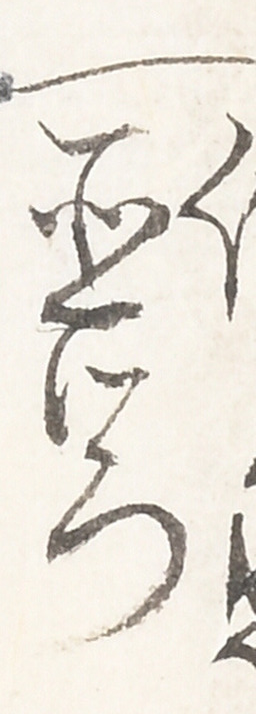所右衛門
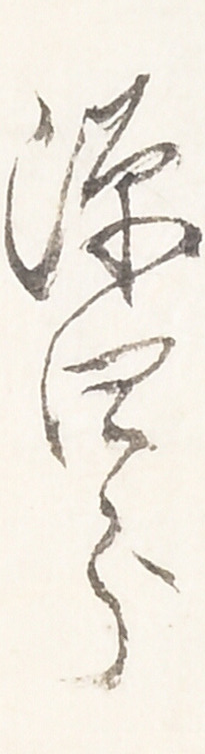岩四郎
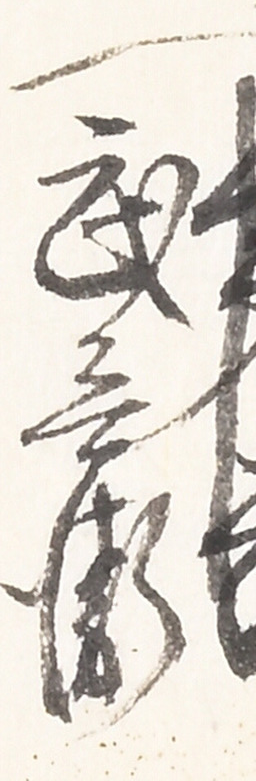武兵衛
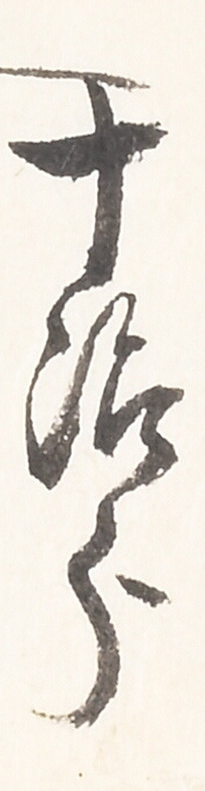才治郎
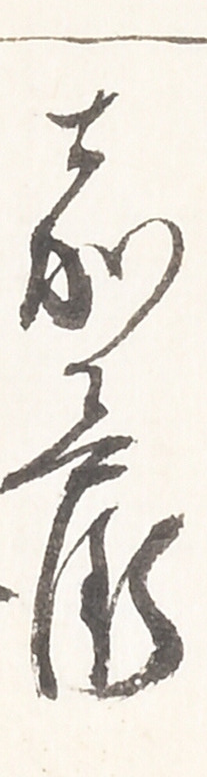嘉兵衛
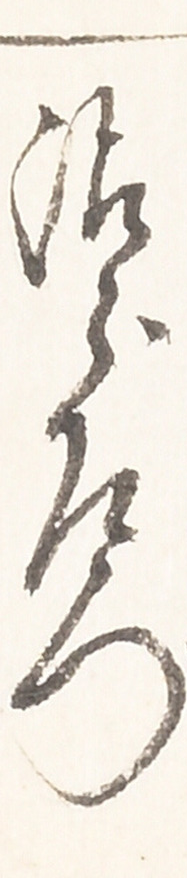治郎左衛門
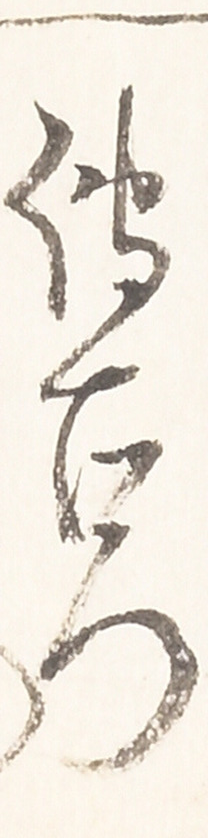伝右衛門
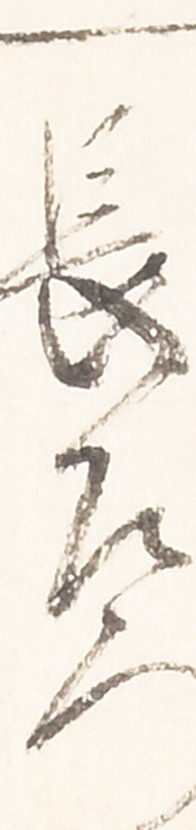長左衛門
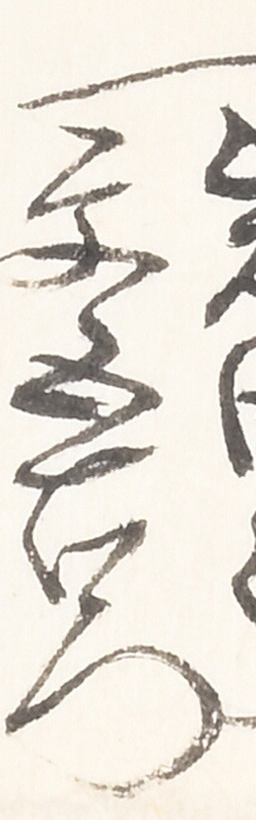文五右衛門
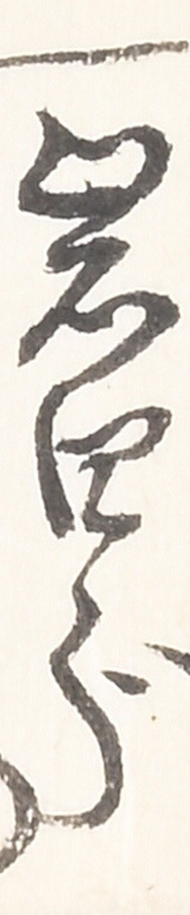岩四郎
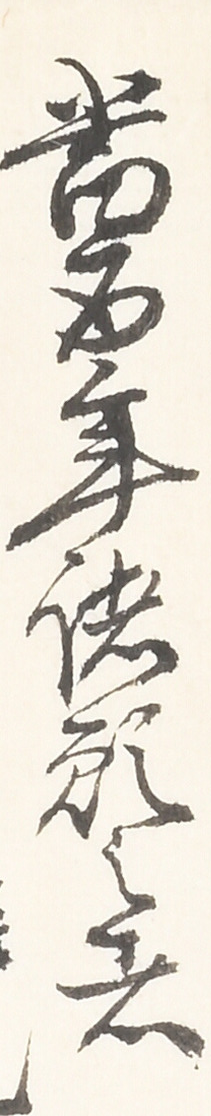当酉年諸願之者
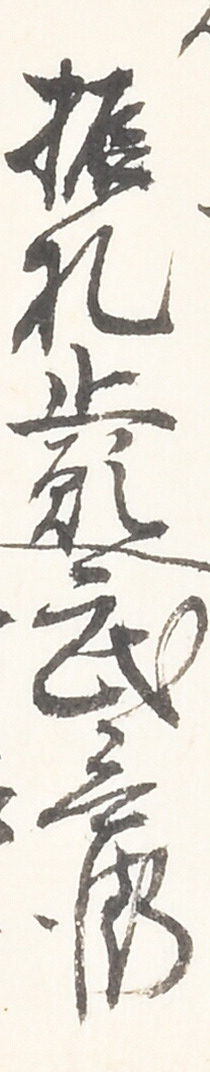振札止願武兵衛
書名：（諸運上控帳）
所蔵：伊那市立高遠町図書館・合同会社AMANE
